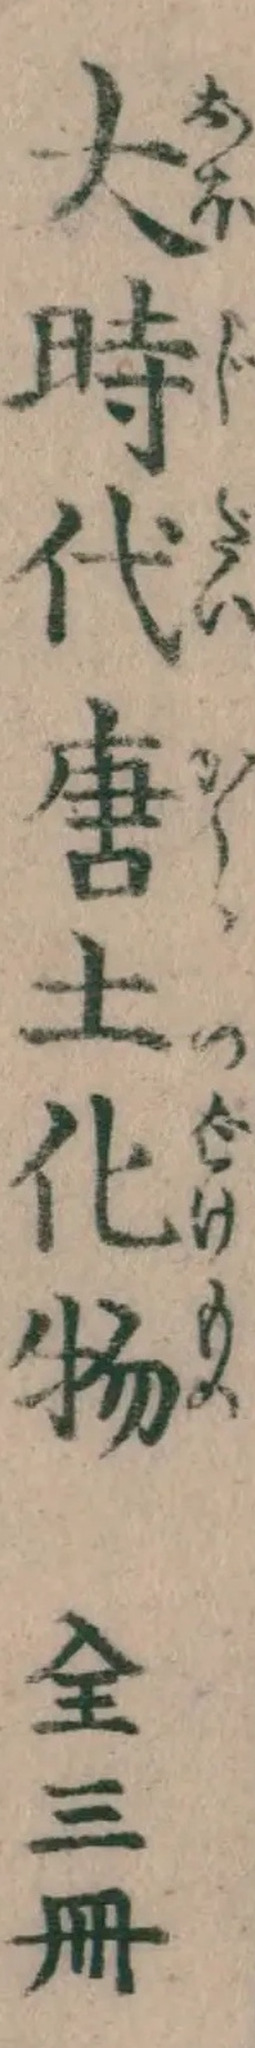大時代唐土化物全三冊
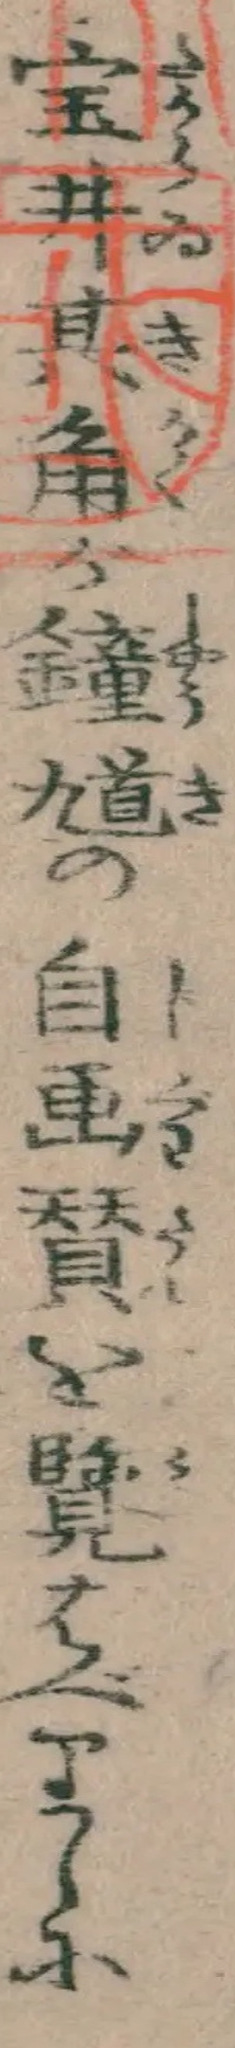宝井其角が鍾馗の自画賛を覧はべりしに
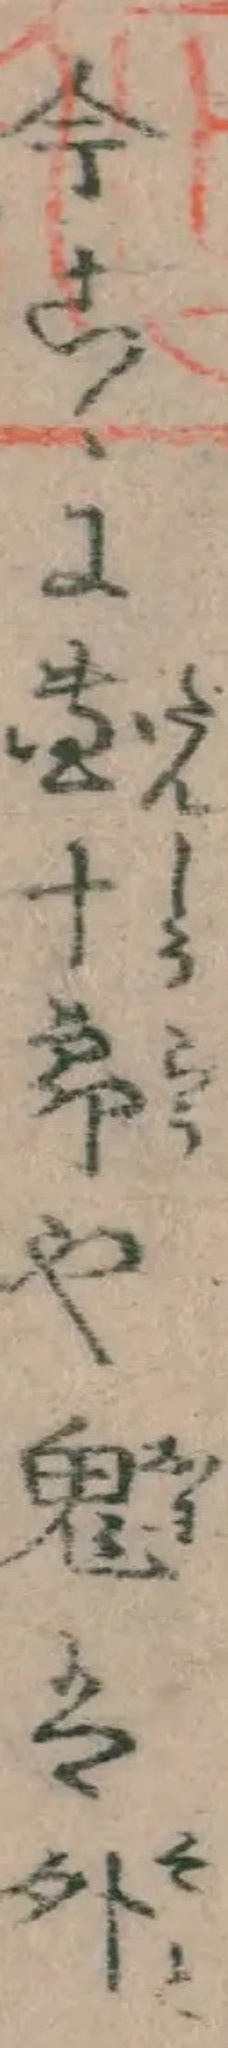今こゝに団十郎や鬼は外
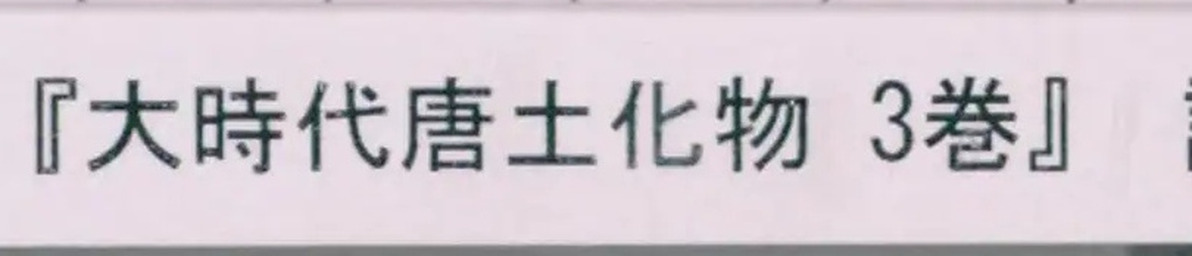大時代唐土化物全三冊
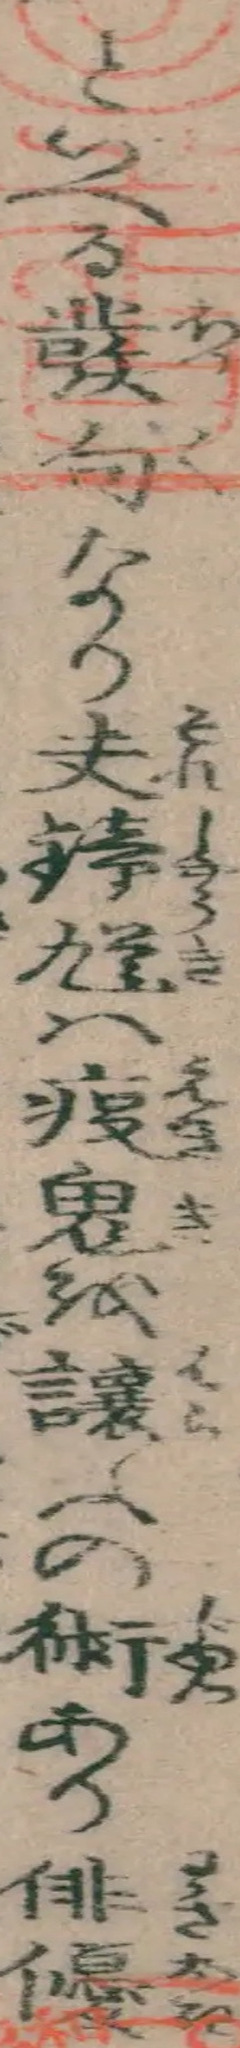といへる発句なり夫鍾馗は疫鬼を讓ふの術あり俳優
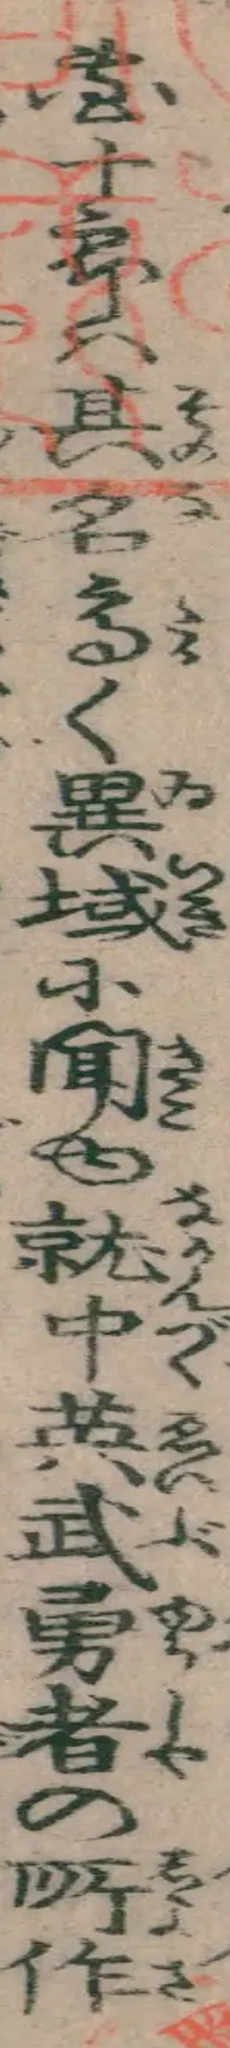団十郎は其名高く異域に聞ゆ就中英武勇者の所作
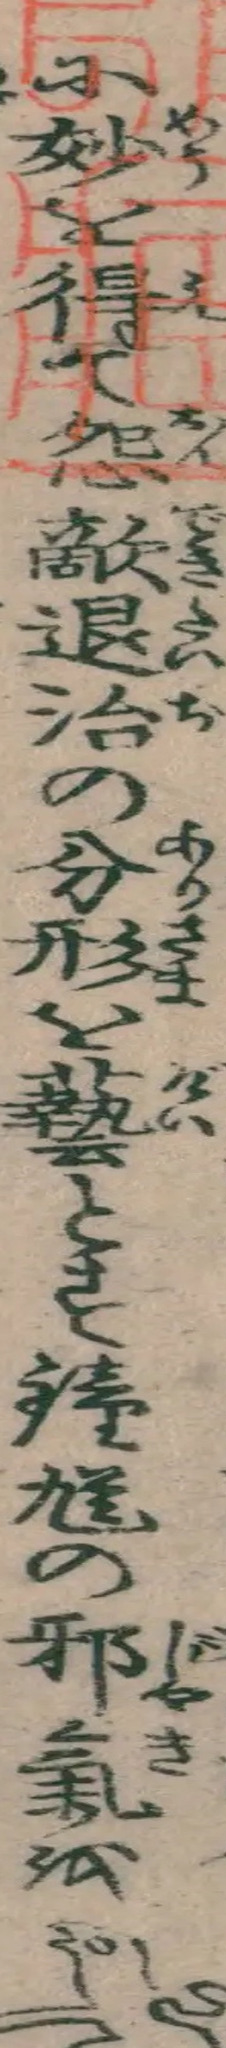に妙を得て怨敵退治の分形を芸とす鍾馗の邪気を
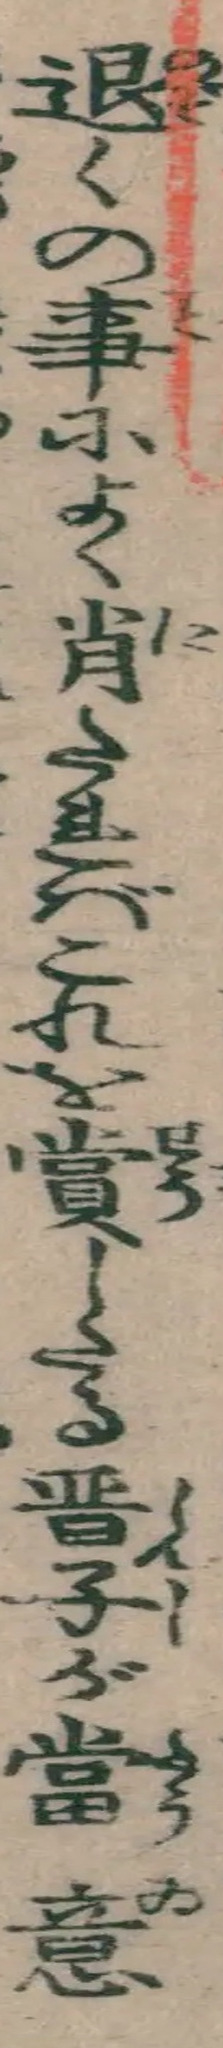退くの事によく肖たればこれを賞したる晋子が当意
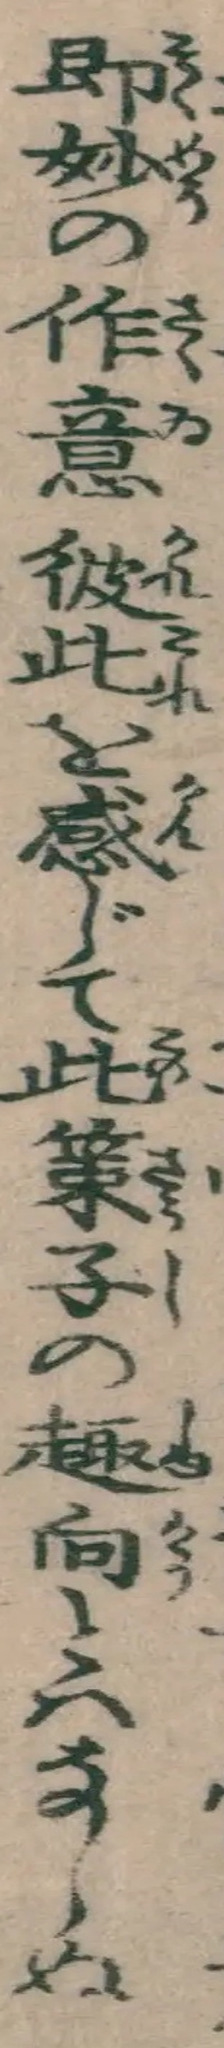即妙の作意彼是を感じて此策子の趣向とはなしぬ
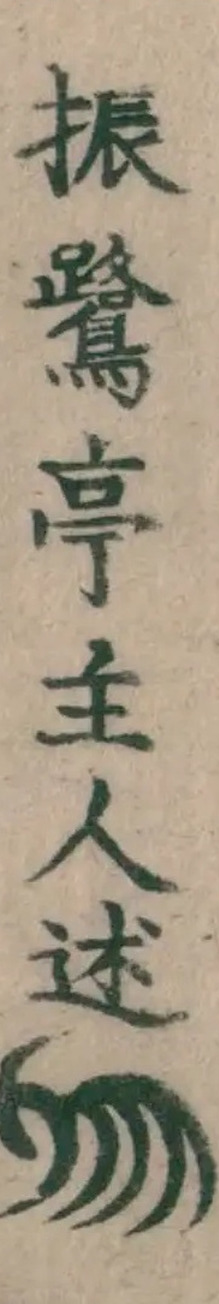振鷺亭主人述

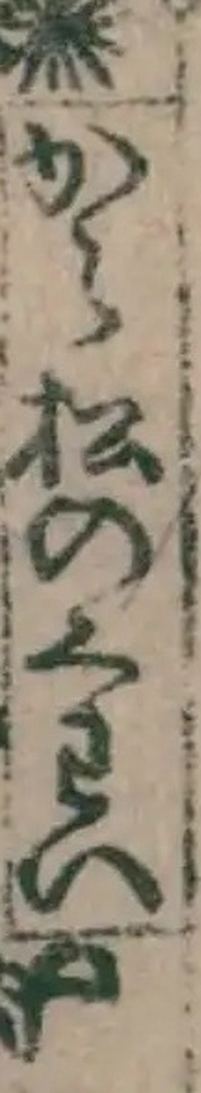から松のくわい
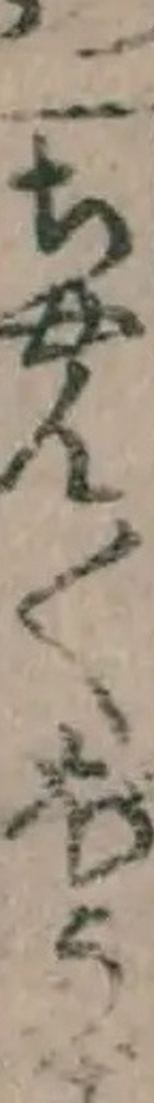ちやん〳〵ぼうず
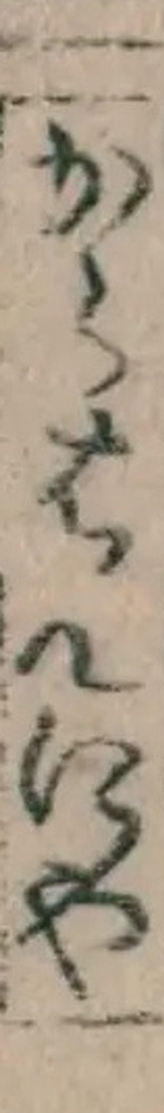からはんにや
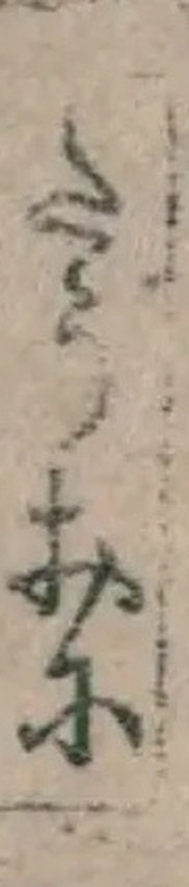たうおに
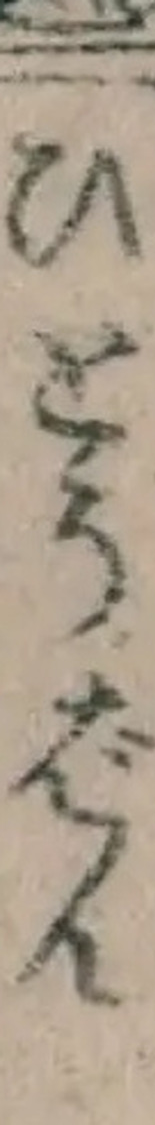ひとうばん
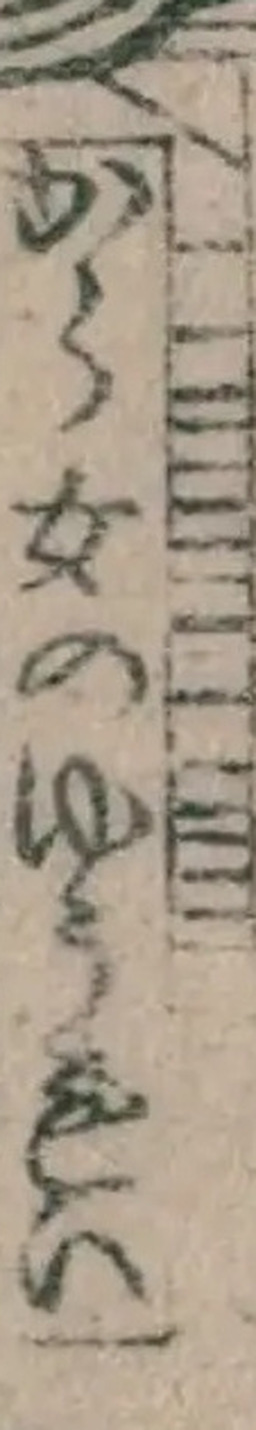から女のゆうれい
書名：大時代唐土化物 3巻
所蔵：国立国会図書館 National Diet Library, JAPAN
